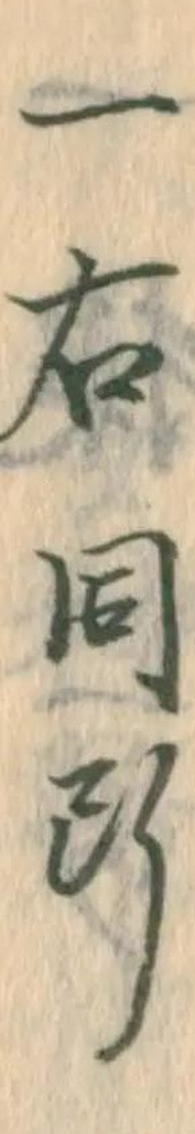一右同断
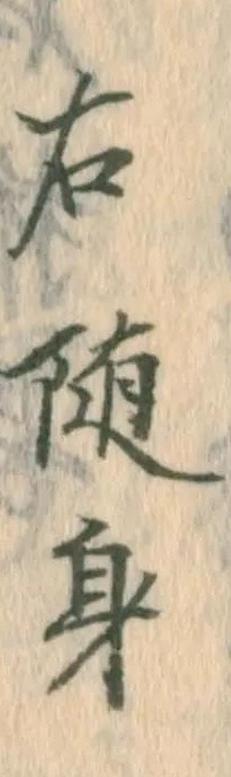右随身
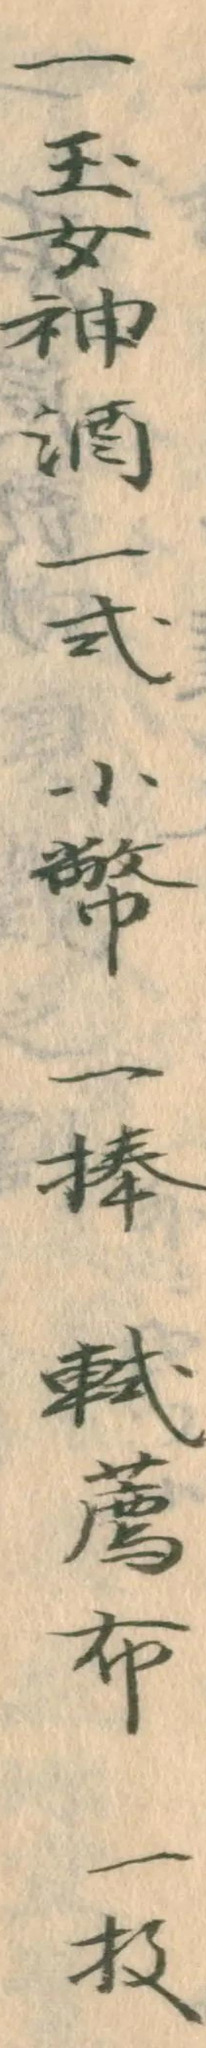一玉女神酒一式小幣一捧軾薦布一枚
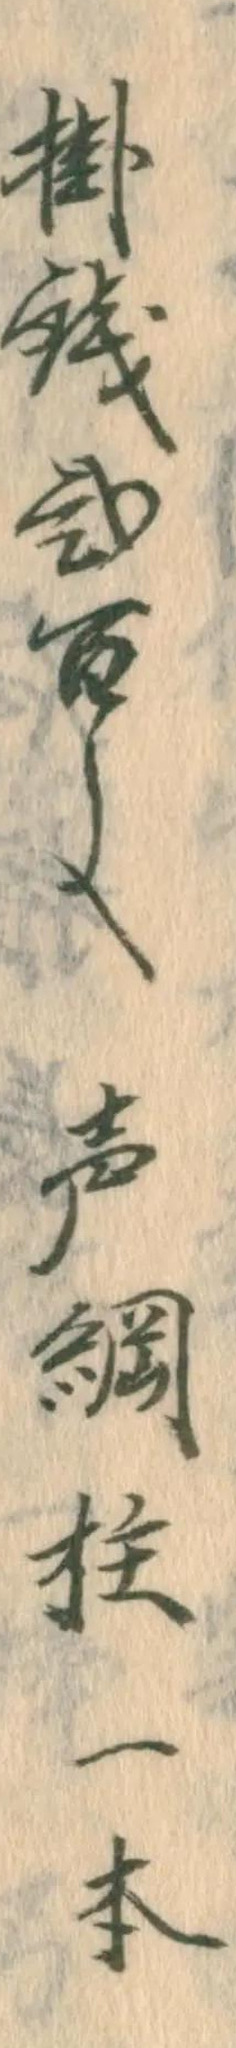掛銭弐百文声綱柱一本
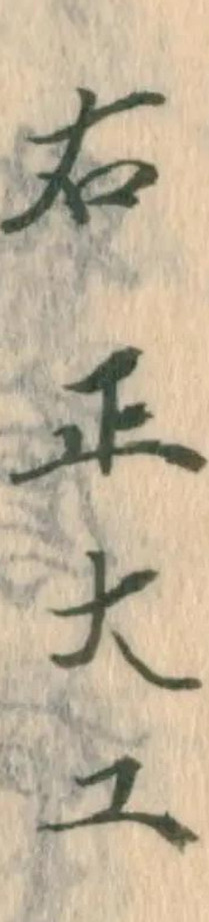右正大工
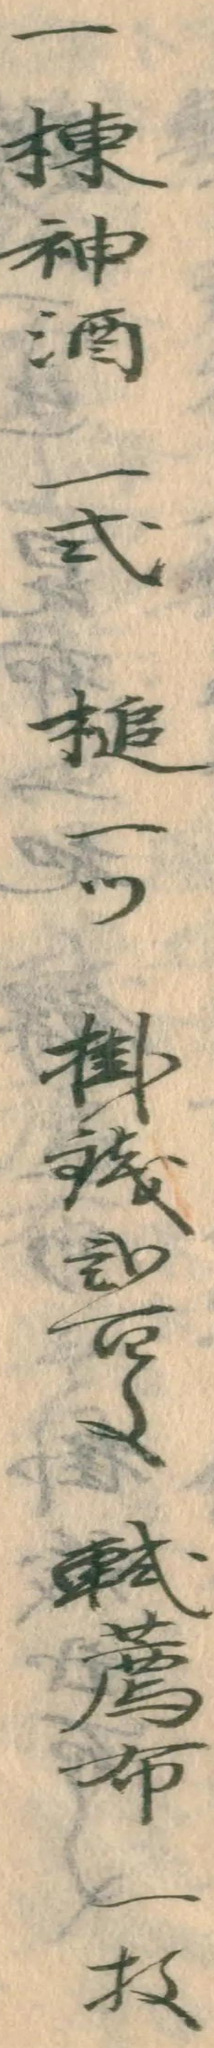一棟神酒一式槌一ッ掛銭弐百文軾薦布一枚
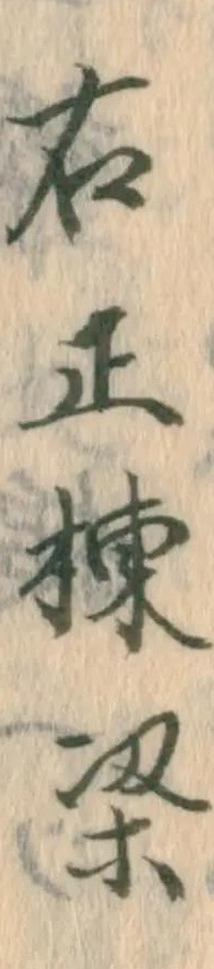右正棟梁
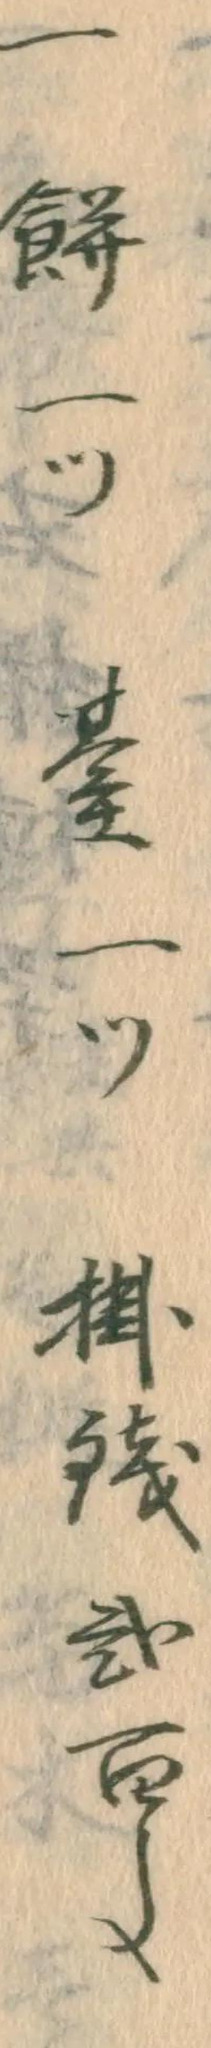一餅一ツ台一ツ掛銭弐百文
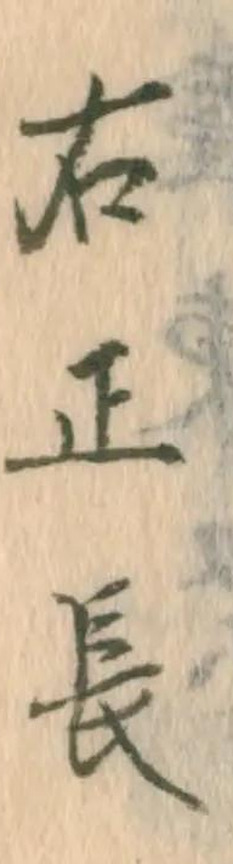右正長
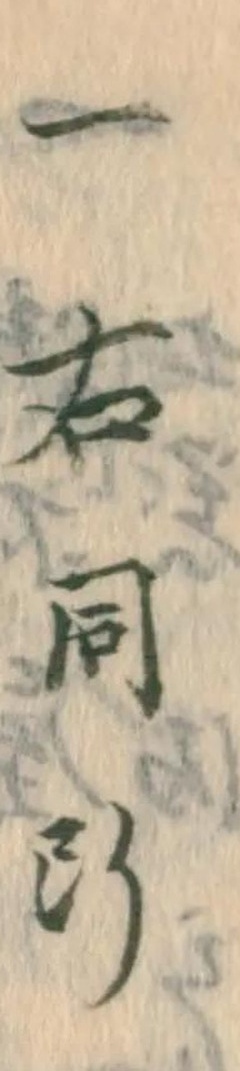一右同断
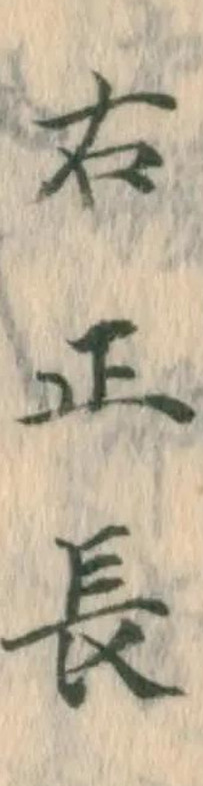右正長
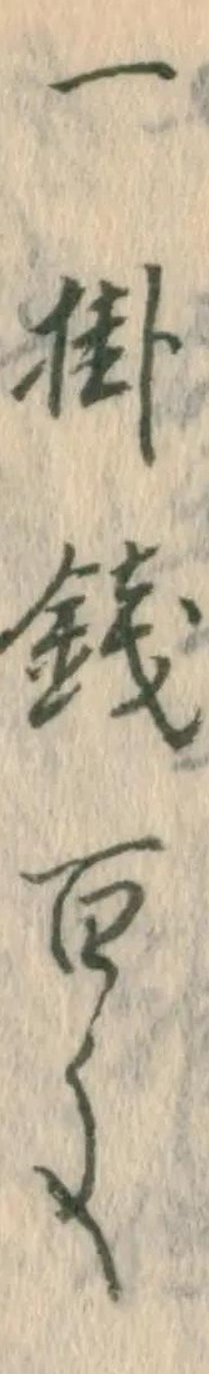一掛銭百文
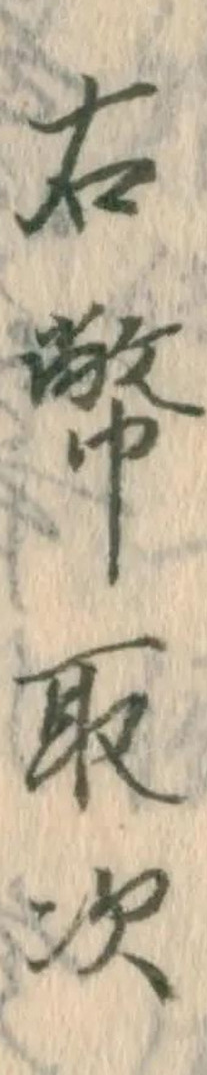右幣取次
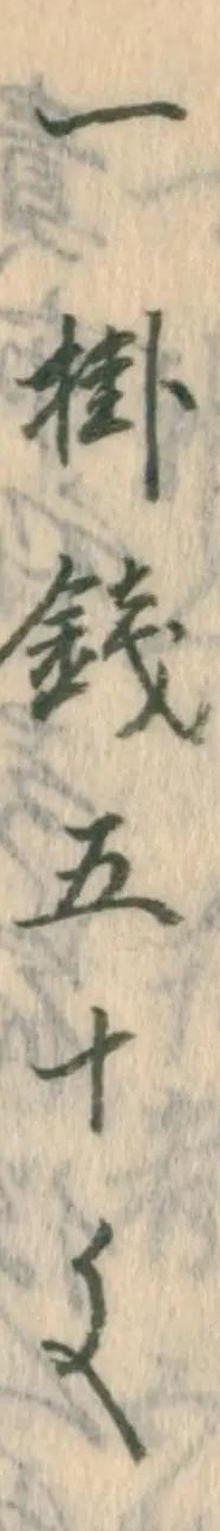一掛銭五十文
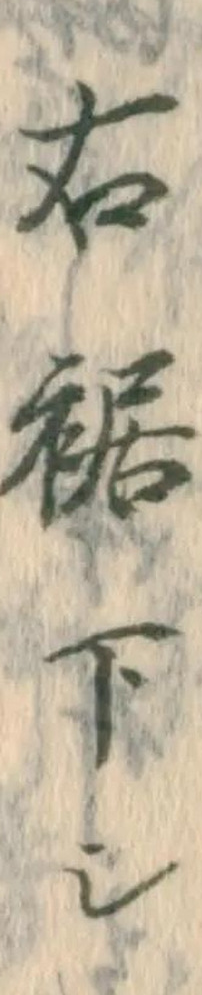右裾下シ
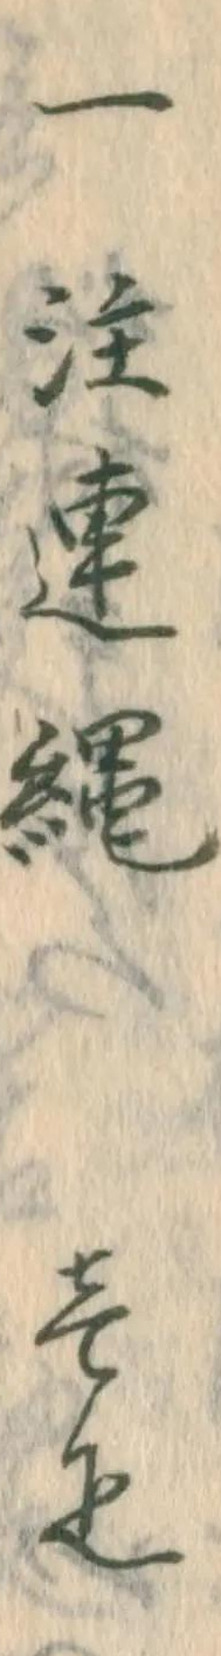一注連縄壱疋
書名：賀茂社記録. 第17冊
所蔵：国立国会図書館 National Diet Library, JAPAN
